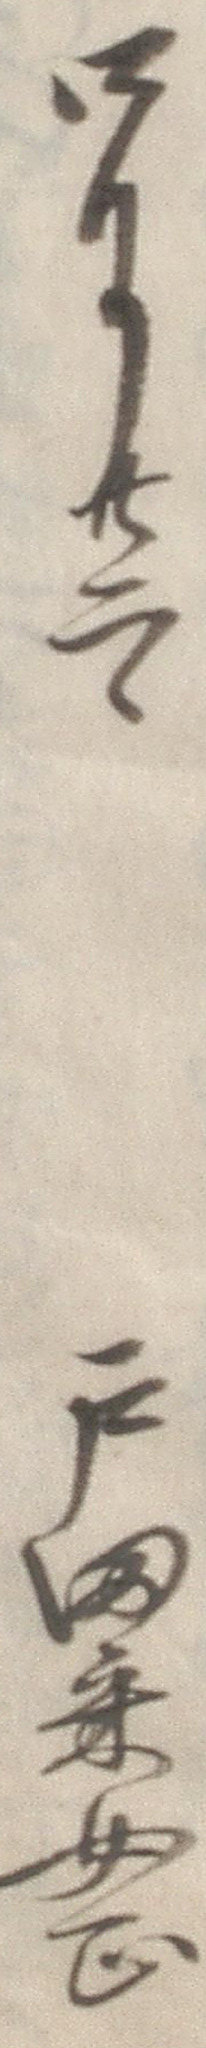四月廿二日戸田采女正
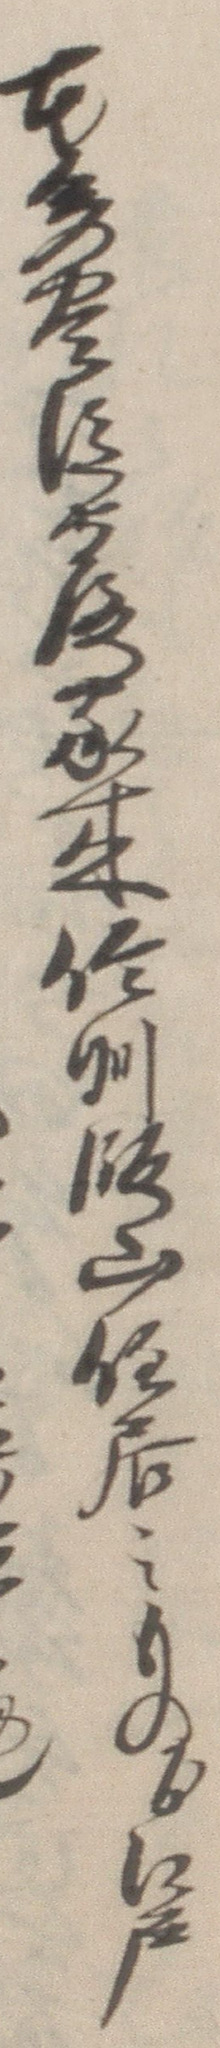本多豊後守殿家来信州飯山住居之ものゟ江戸
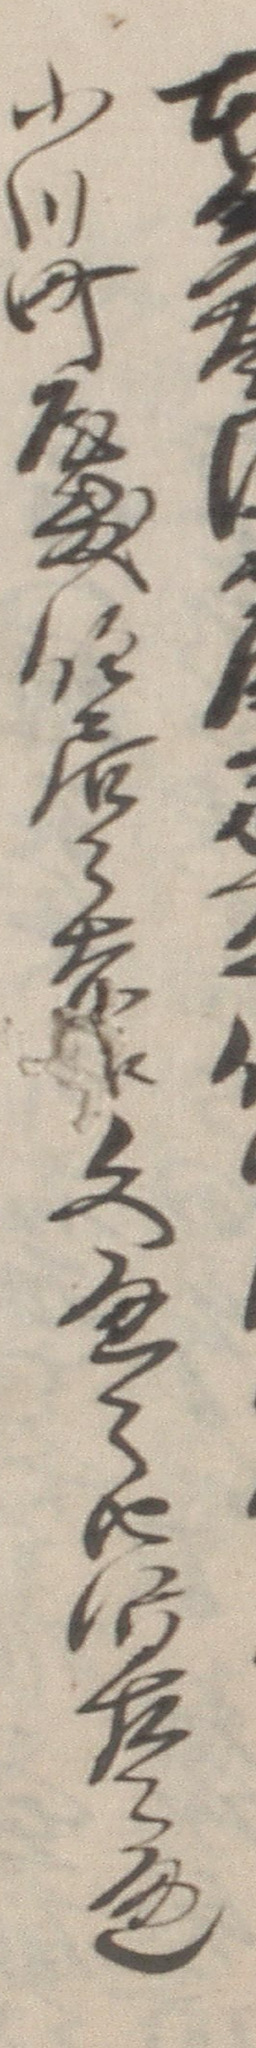小川町屋敷住居之者江文通之由写左之通
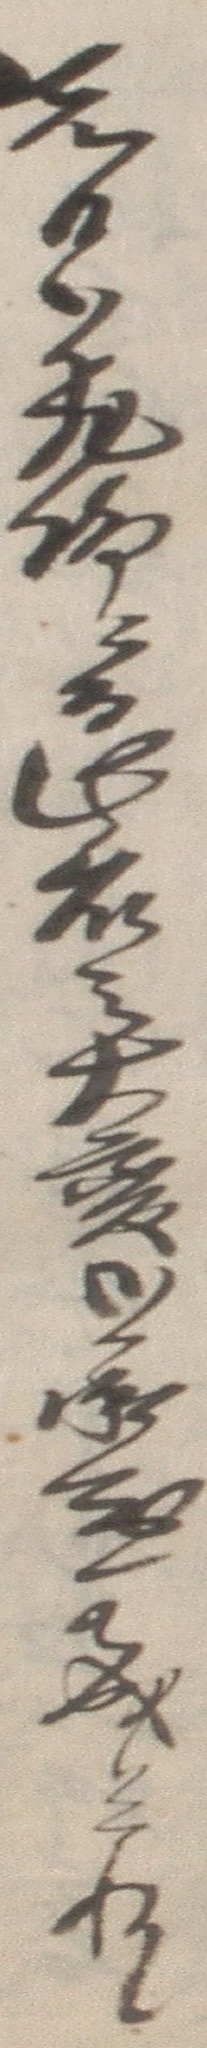先日御飛脚二而此度之大変御承知被成御座候
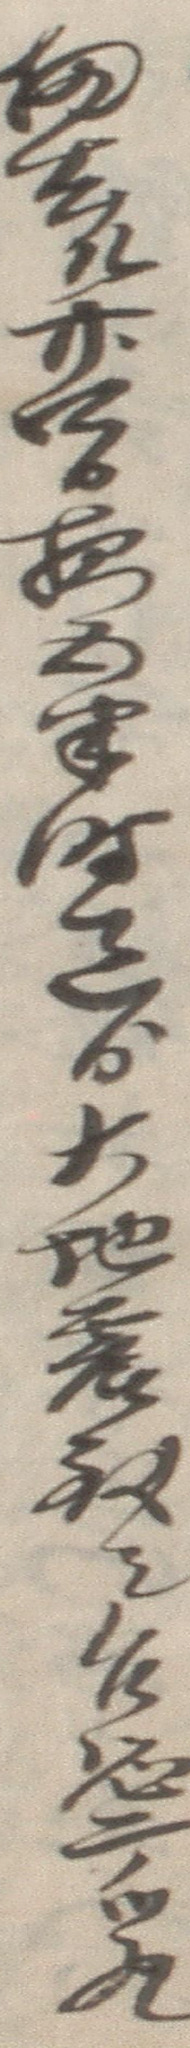扨去ㇽ廿四日夜五半時過ゟ大地震致ㇱ乍恐二ノ御丸
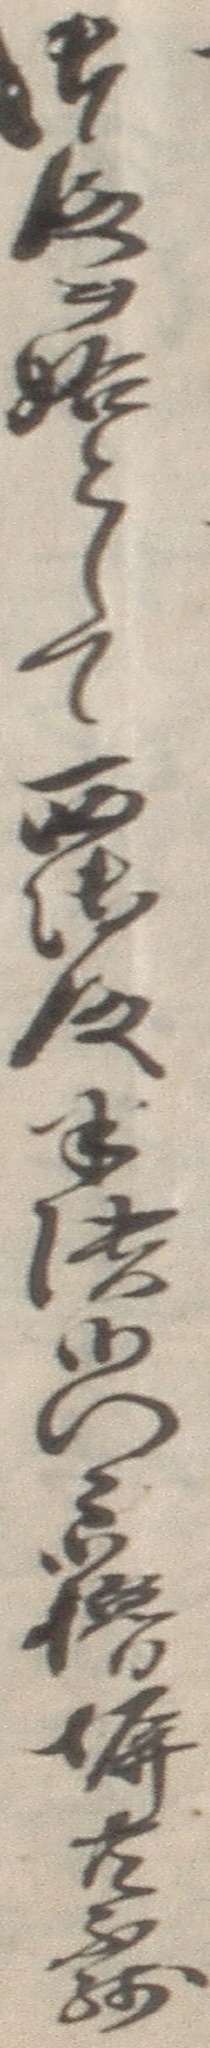御殿ヲ始として西御殿半潰御門二御櫓塀共不残
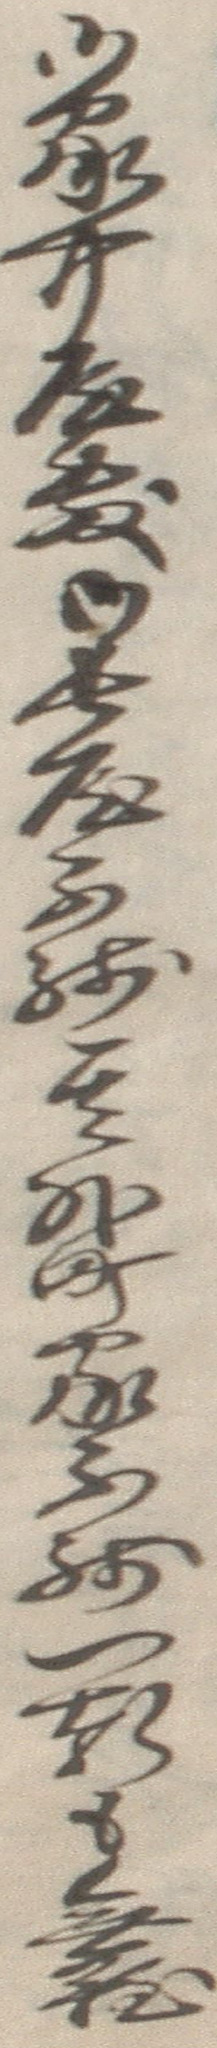御家中屋敷御長屋不残其外町家不残一軒も無難
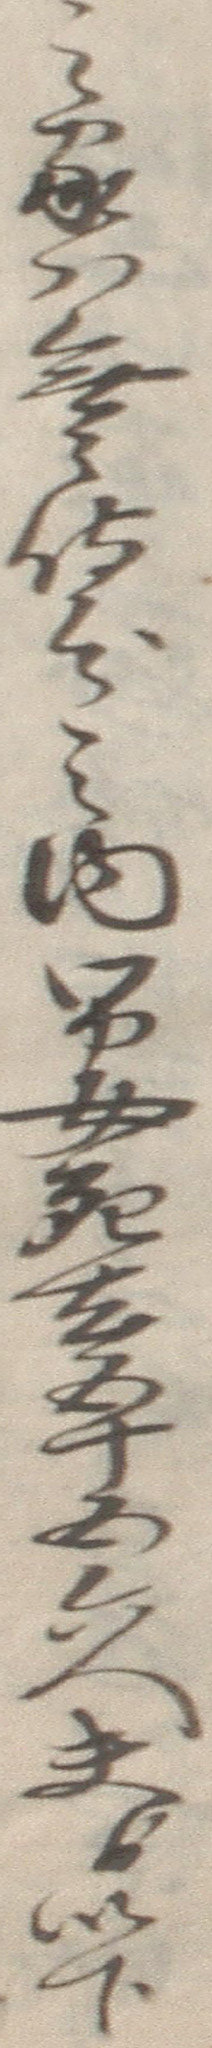之家ハ無之侍分之内男女死去五十五六人夫ゟ以下
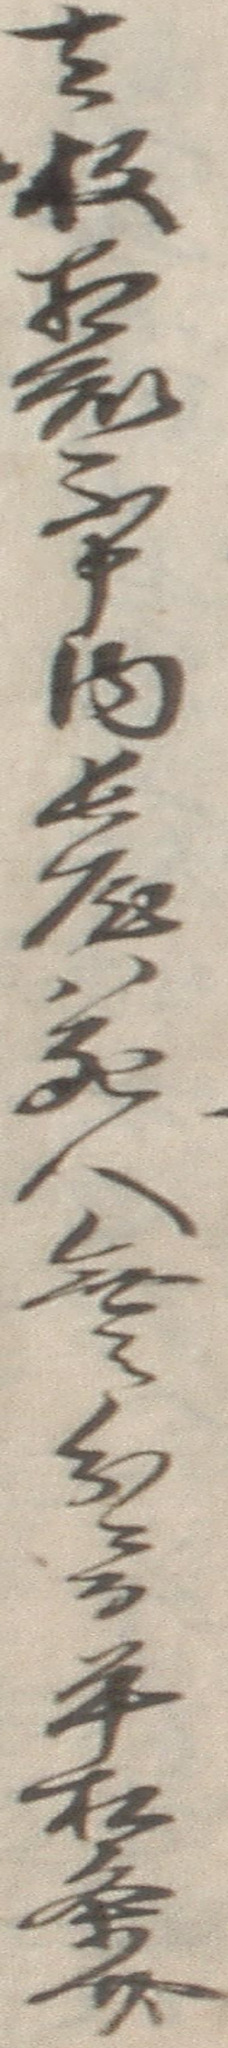は数相知不申内長屋ハ死人無之分二而平松条介
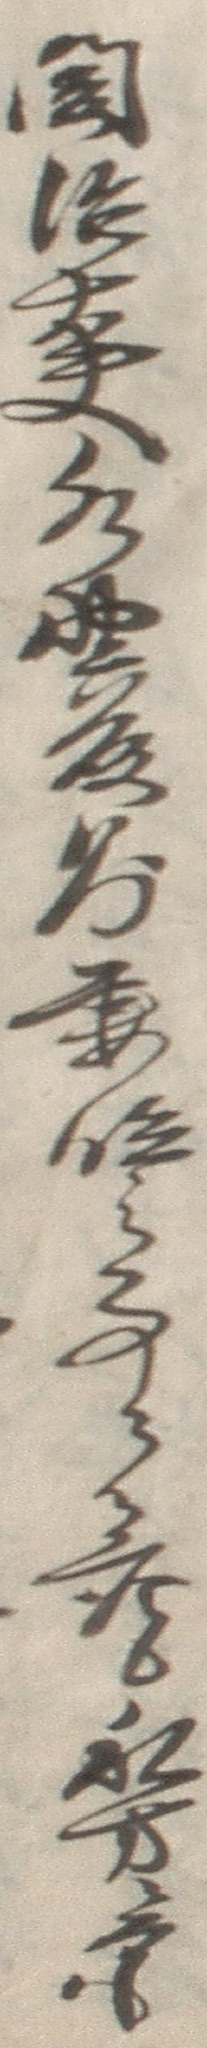関治太夫水野藤右衛門妻位之事二御座候私方二而も
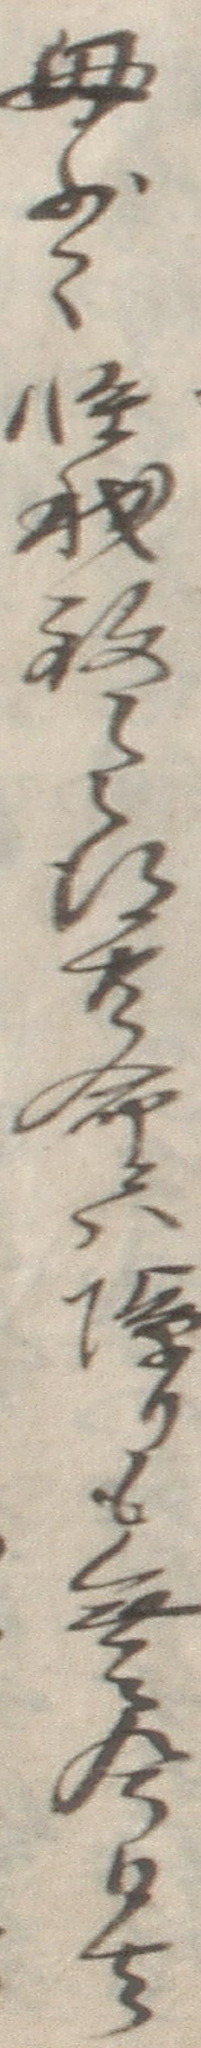母少々怪我致し候得共命二ハ障りも無之今日は
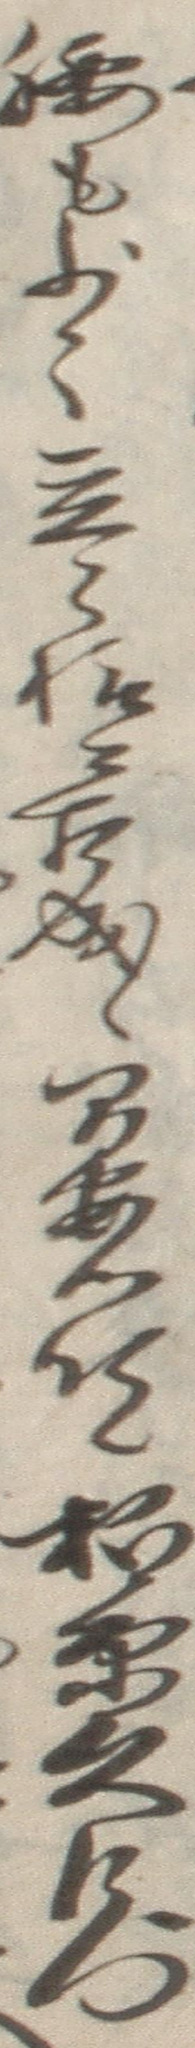腰も少々立候様二相成候間安心仕候松原久右衛門
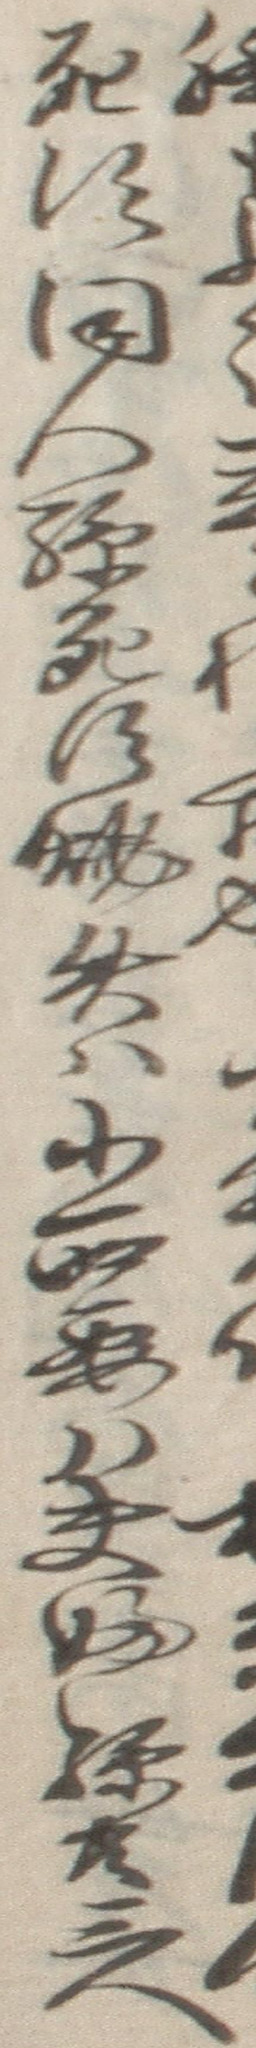死す同人孫死す焼失ハ小西要八夫婦孫共三人

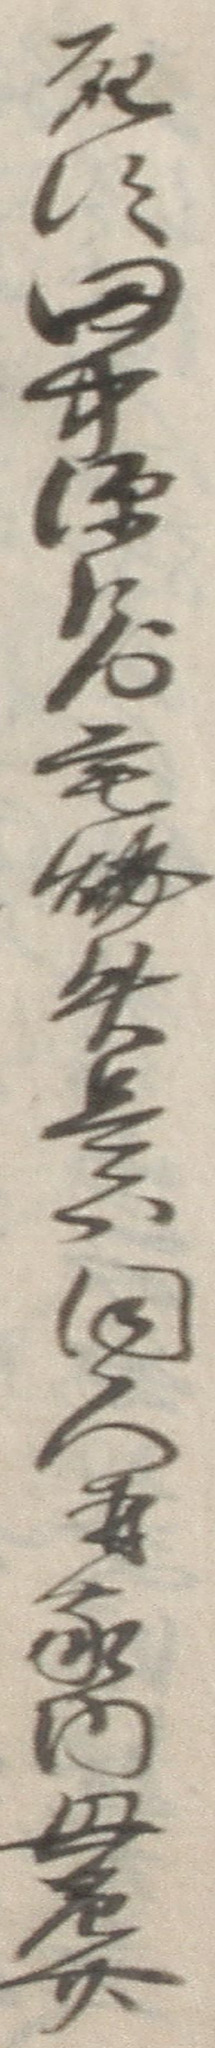死す田中源右衛門宅焼失是ハ同人并家内母厄介
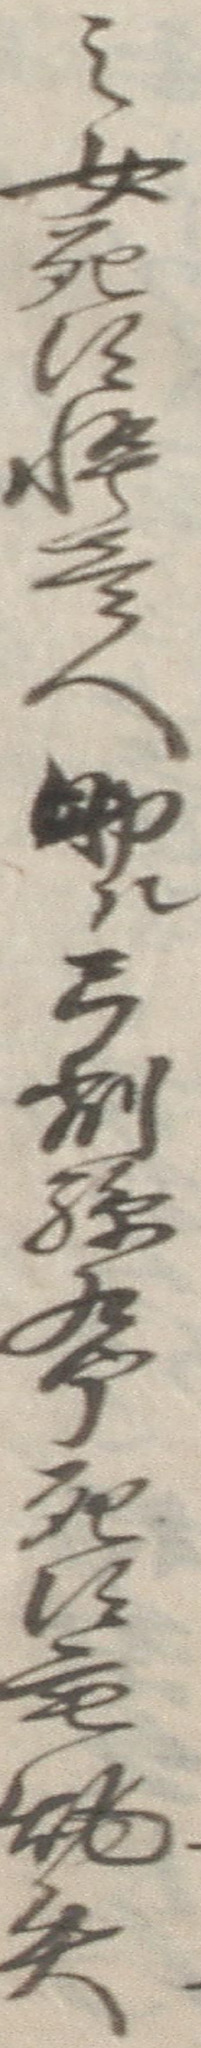之女死す忰壱人助ㇽ弓削孫九郎死す宅焼失
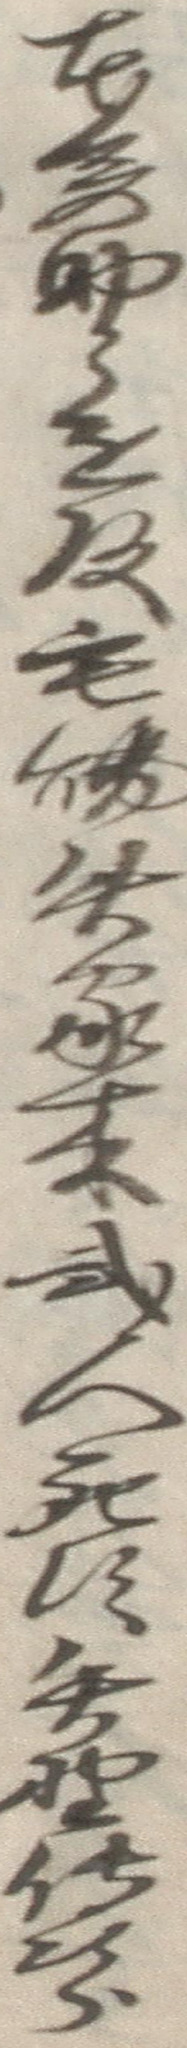本多助之進殿宅焼失家来弐人死す矢野伝次郎
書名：信州地震一件
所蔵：東京大学地震研究所図書室 Earthquake Research Institute Library, The University of Tokyo, JAPAN
